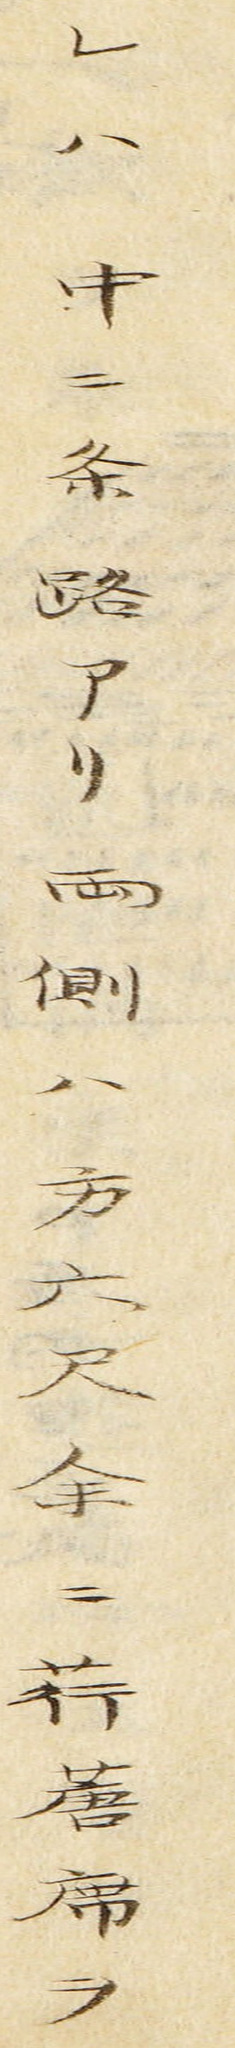レハ中ニ条路アリ両側ハ方六尺余ニ荇蓎席ヲ
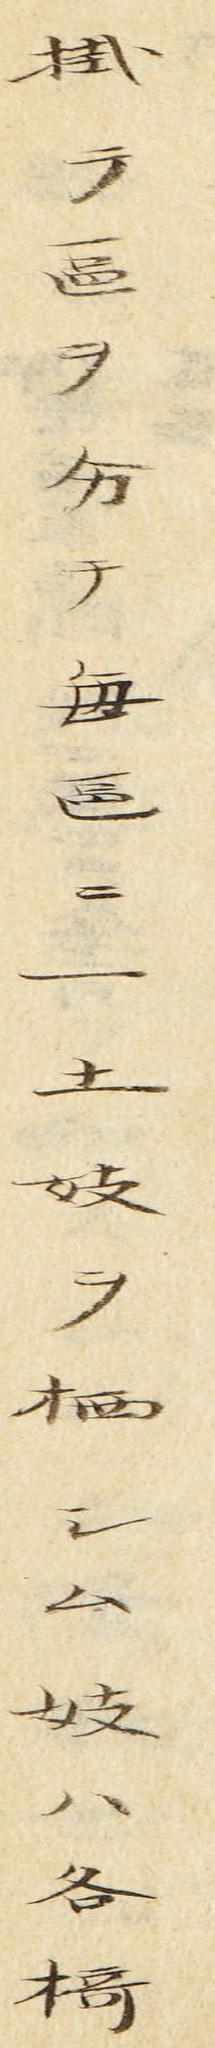掛テ区ヲ分チ毎区ニ一土妓ヲ栖シム妓ハ各椅

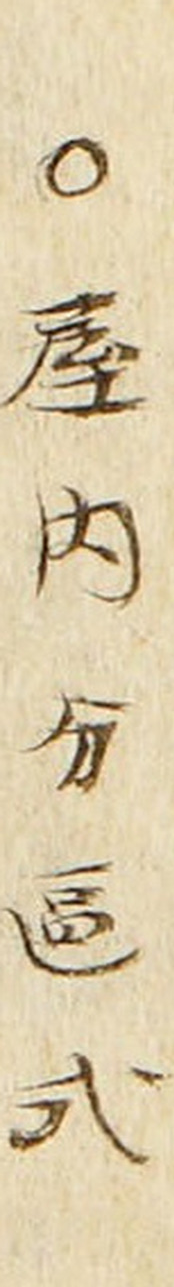◦屋内分区式
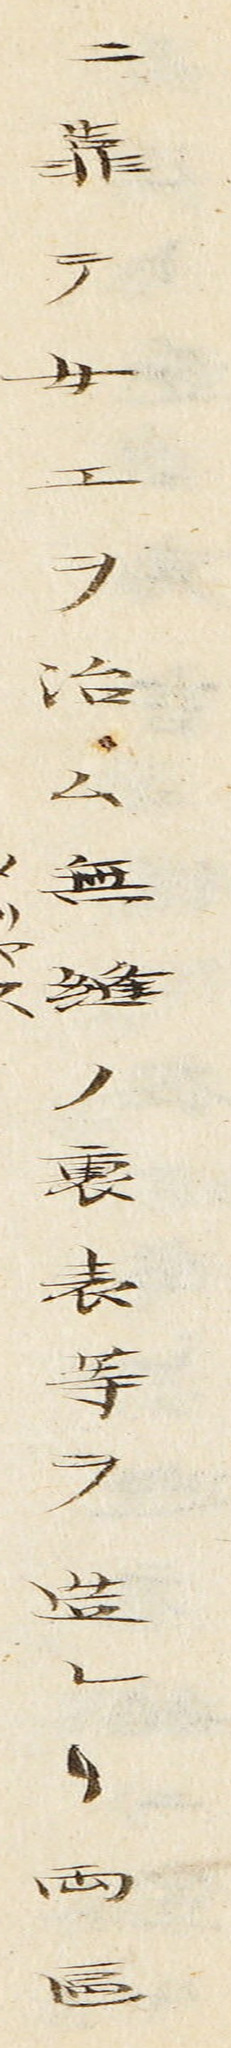ニ靠テ女工ヲ治ム無縫ノ裏表等ヲ造レリ両区
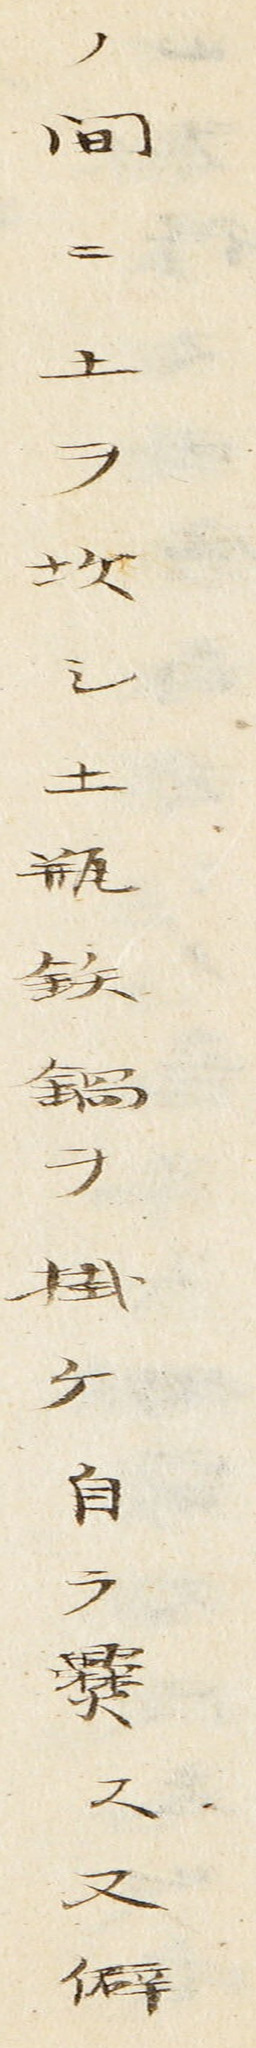ノ間ニ土ヲ坎シ土瓶鉄鍋ヲ掛ケ自ラ爨ス又僻
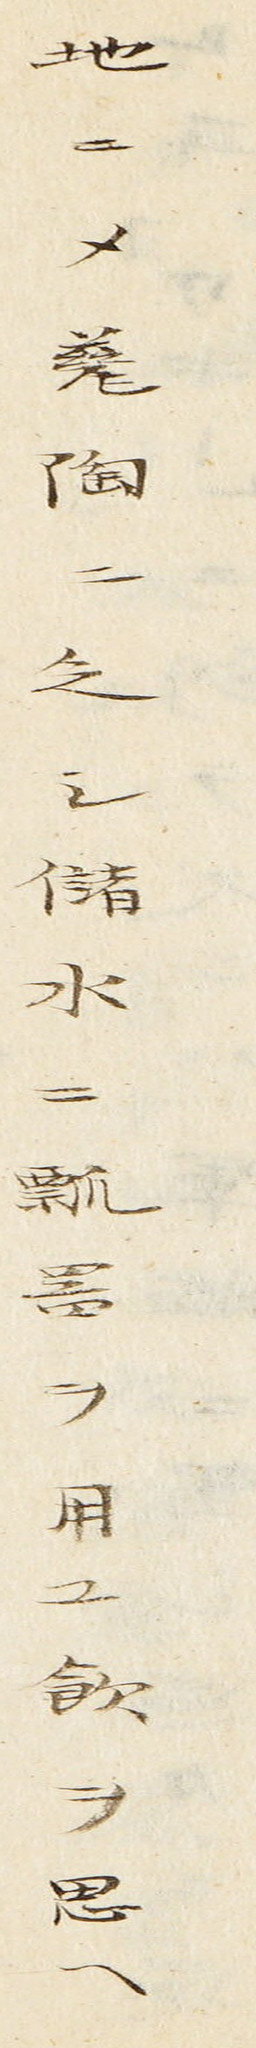地ニシテ甆陶ニ乏シ儲水ニ瓢器ヲ用ユ飲ヲ思ヘ
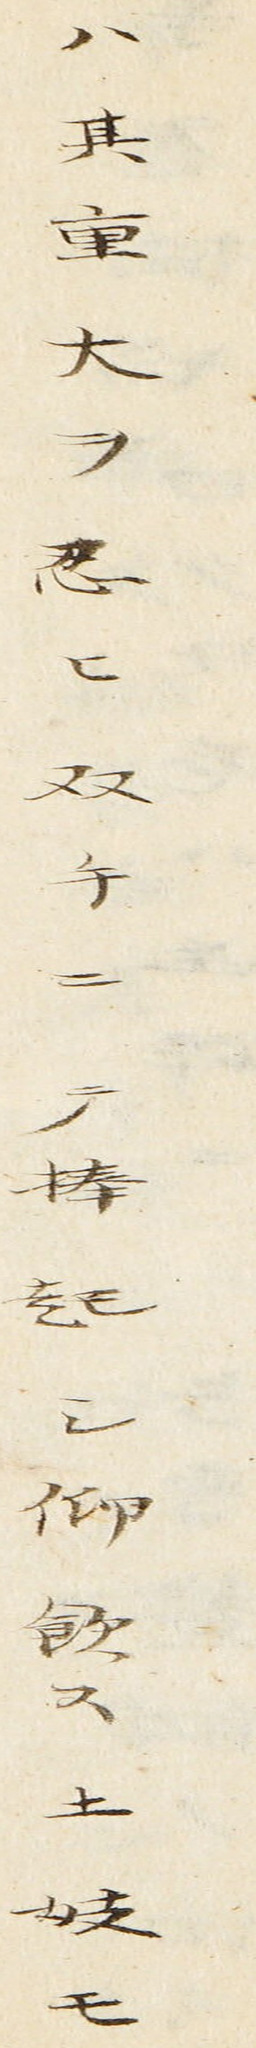ハ其重大ヲ忍ヒ双手ニテ捧起シ仰飲ス土妓モ
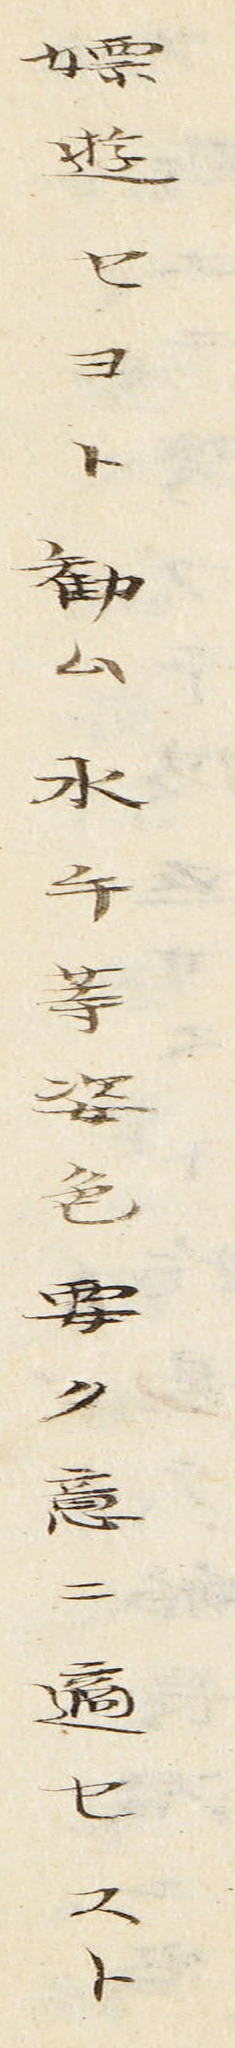嫖遊セヨト勧ム水手等姿色要ク意ニ適セスト
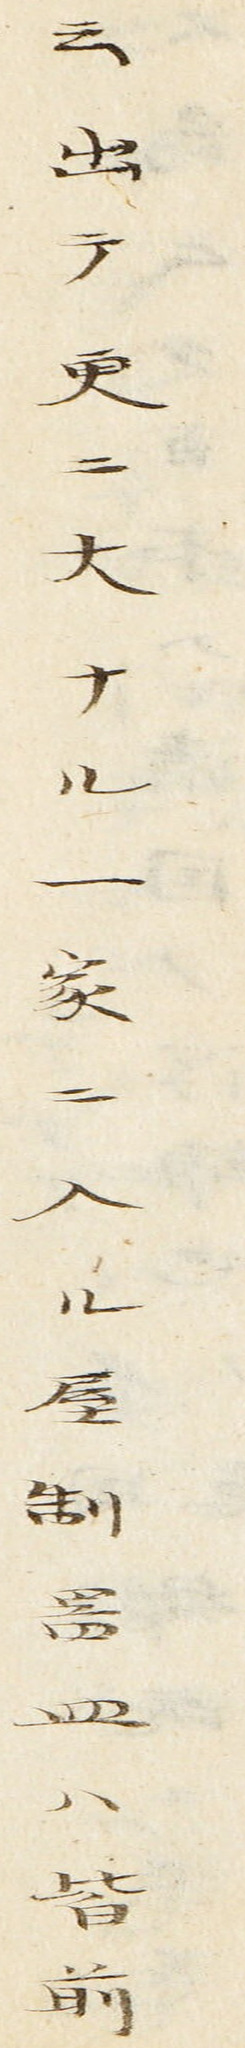云出テ更ニ大ナル一家ニ入ル屋制器皿ハ皆前
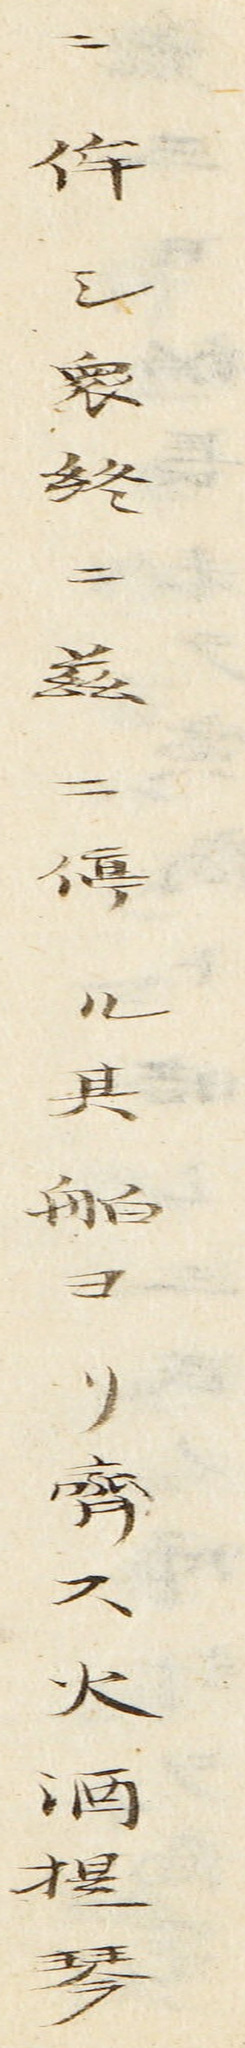ニ侔シ衆終ニ茲ニ停ル其舶ヨリ齊ス火酒提琴
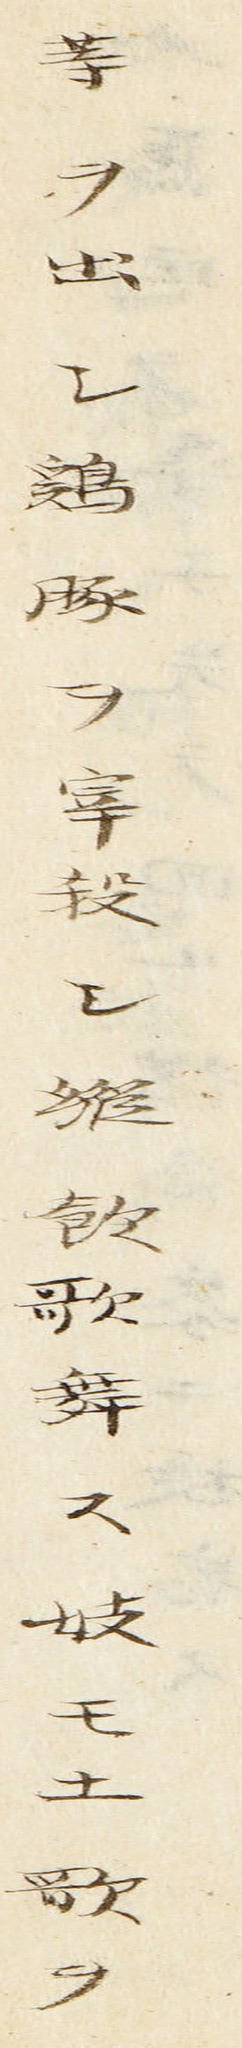等ヲ出シ鶏豚ヲ宰殺シ郷飲歌舞ス妓モ土歌ヲ
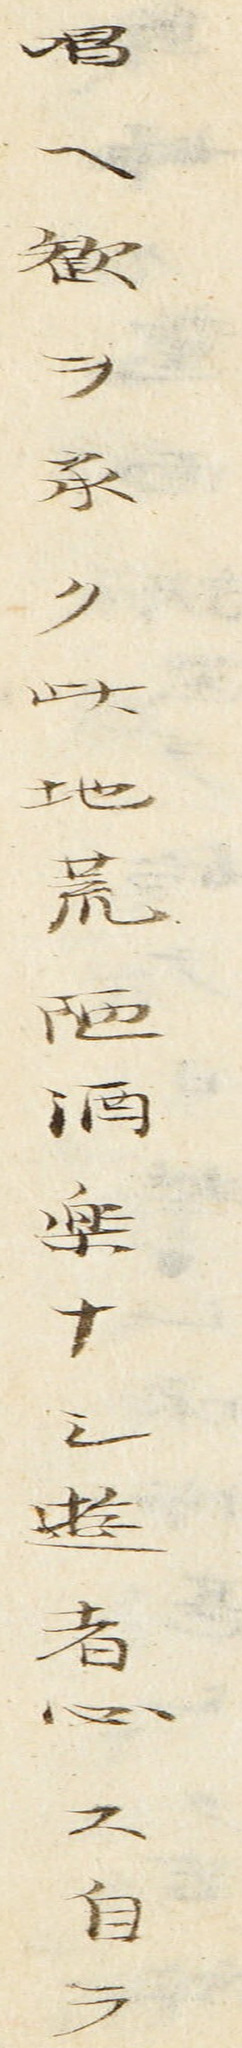唱ヘ歓ヲ承ク此地荒陋酒楽ナシ遊者必ス自ラ
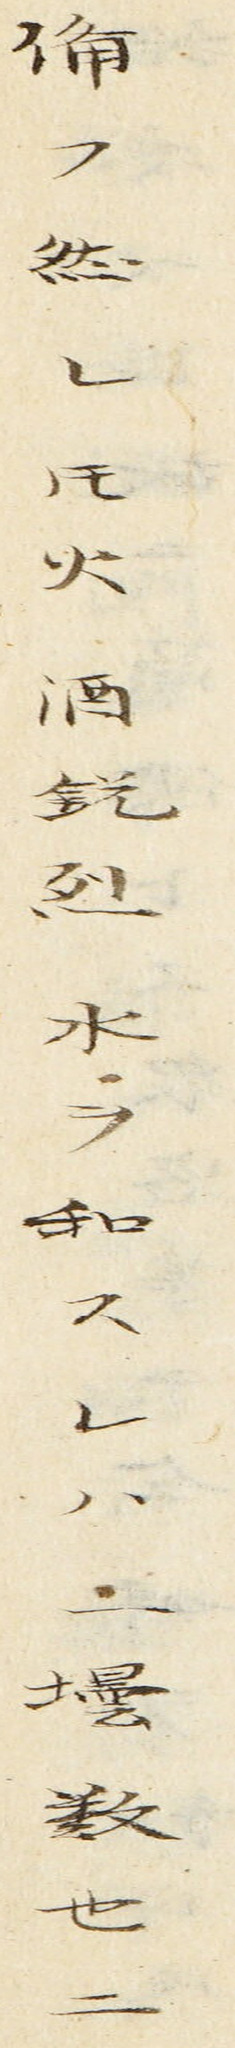備フ然レトモ火酒鋭烈水ヲ和スレハ一壜数也二

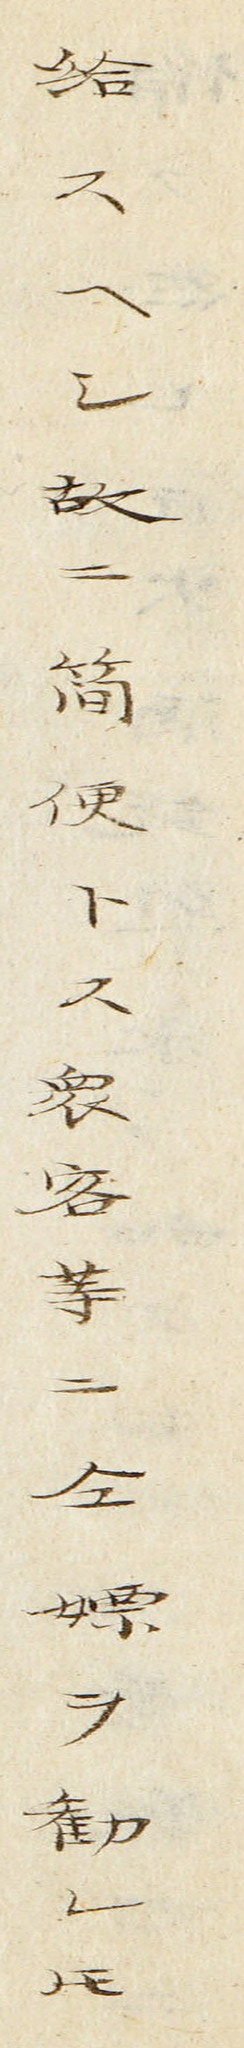給スヘシ故ニ簡便トス衆客等ニ仝嫖ヲ勧レトモ
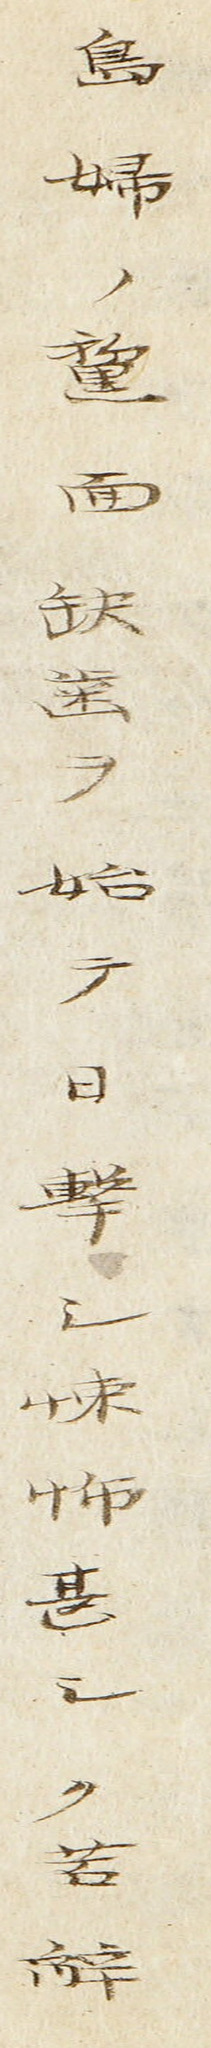島婦ノ黧面欠歯ヲ始テ日撃シ悚怖甚シク苦辞
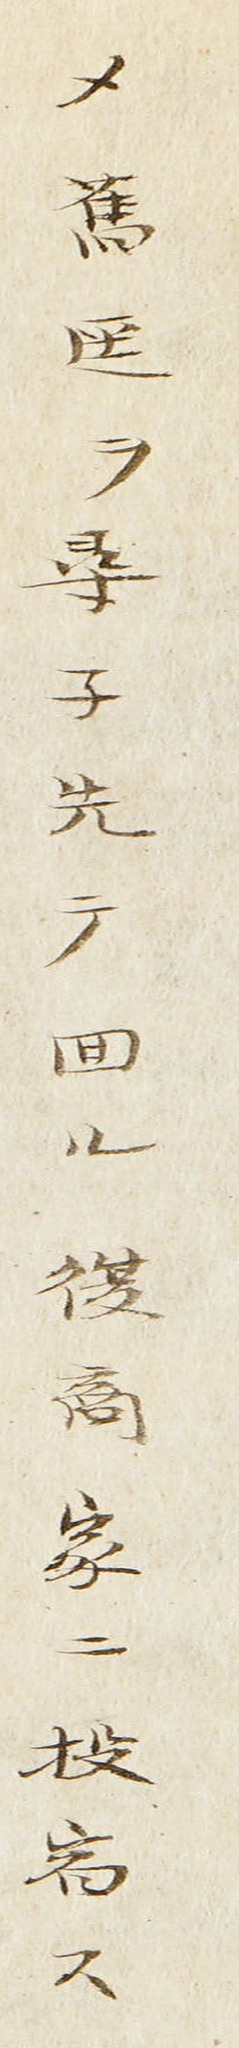シテ旧逕ヲ尋ネ先テ回ル復商家ニ投宿ス
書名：流蕃通書
